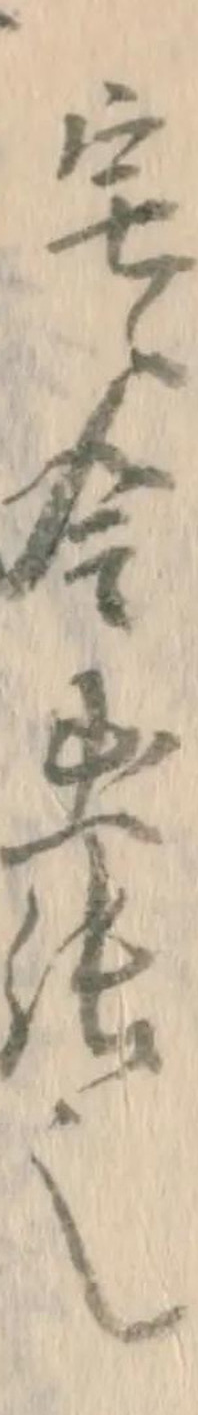宅へ令出張也
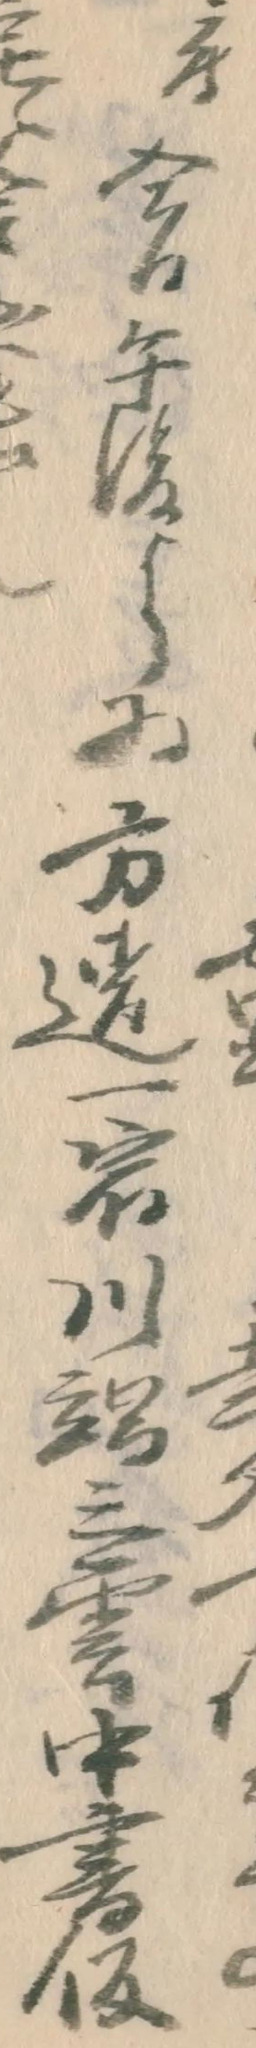ニ付今日午後より為方違一宿川端三雲中書仮
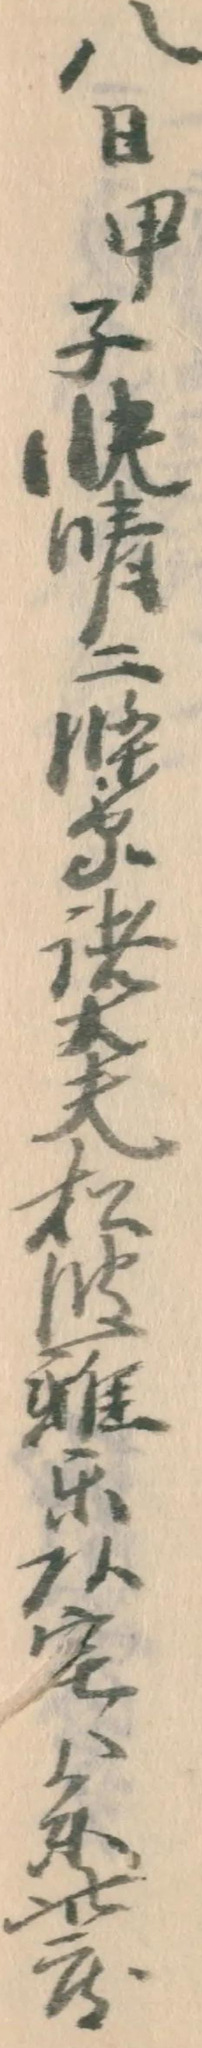八日甲子快晴二條家諸大夫松波雅楽頭宅へ参此度
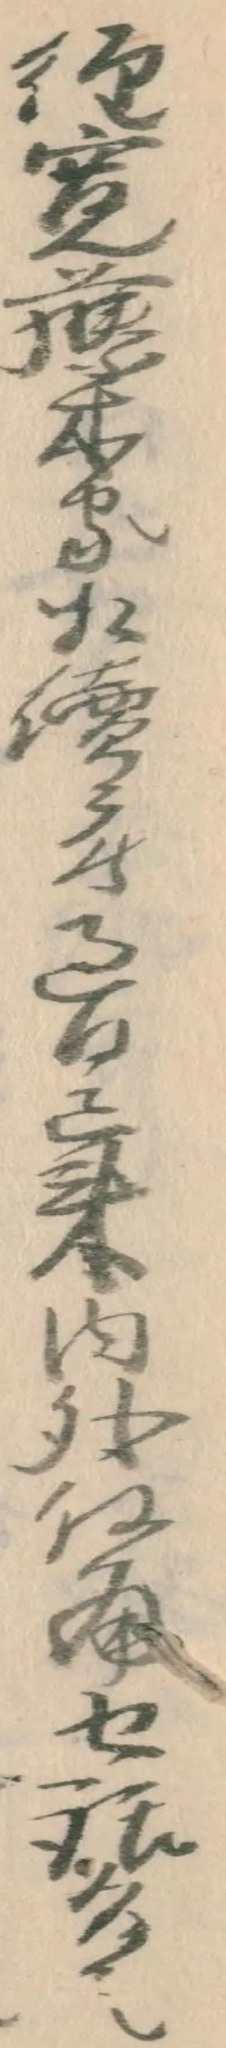経寛藤木家相續ニ付過日已来内外何角セ話有之
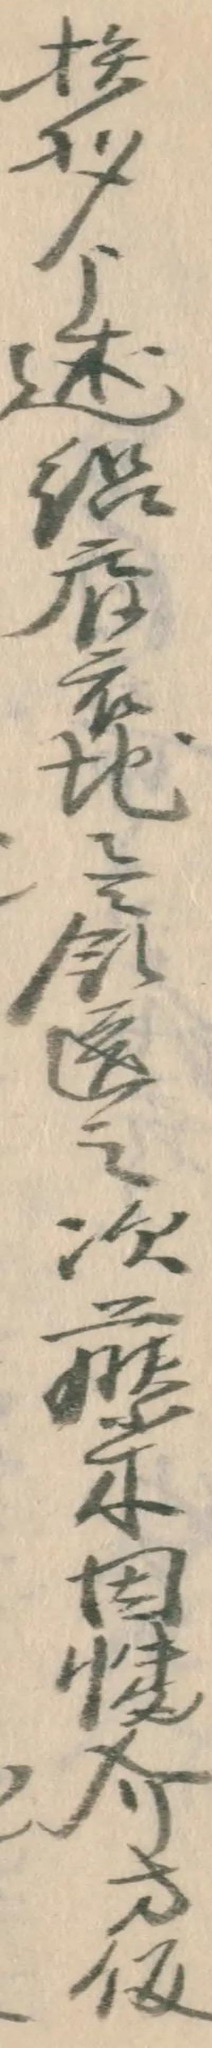挨拶申述組肩衣地壱領送之次藤木因幡介方仮
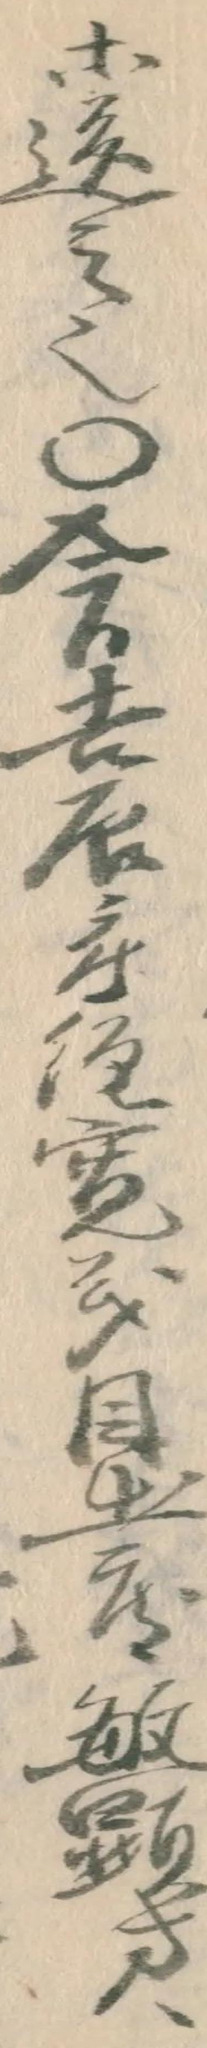等送之也○今日吉辰ニ付経寛義目出度敏顕方へ
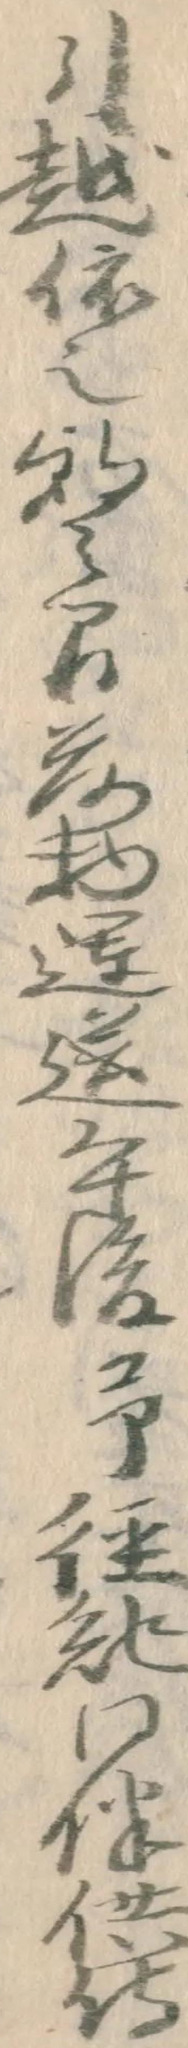引越依之朝之間荷物運送午後予経紀同伴供侍
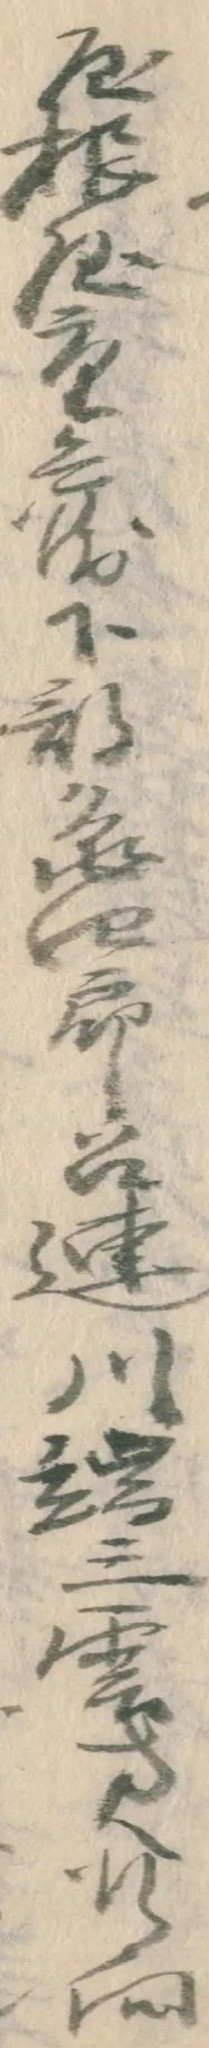屋根屋重兵衛下郡亀四郎召連川端三雲方へ行向
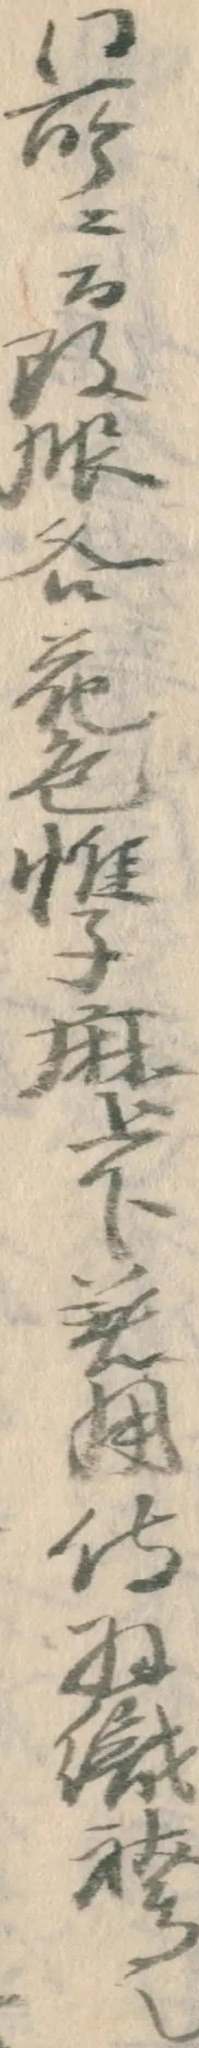同所ニ而改服各花色帷子麻上下着用侍羽織袴也
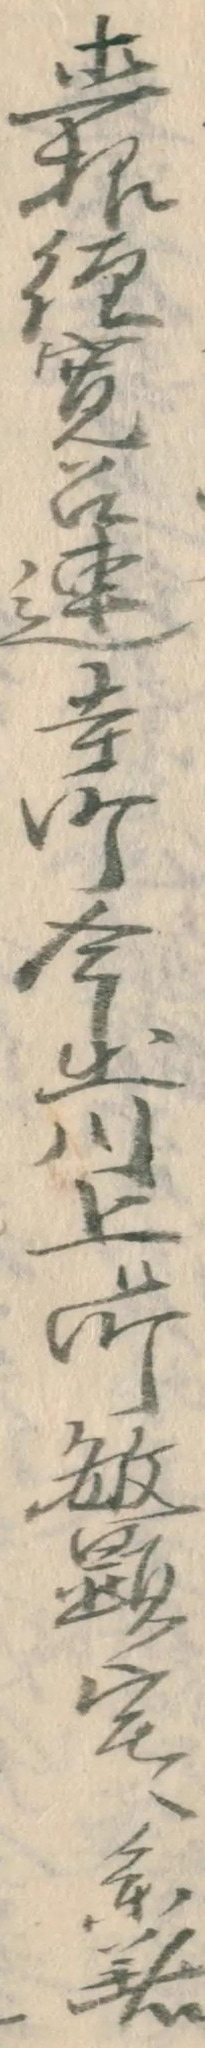直様経寛召連寺町今出川上町敏顕宅へ参着
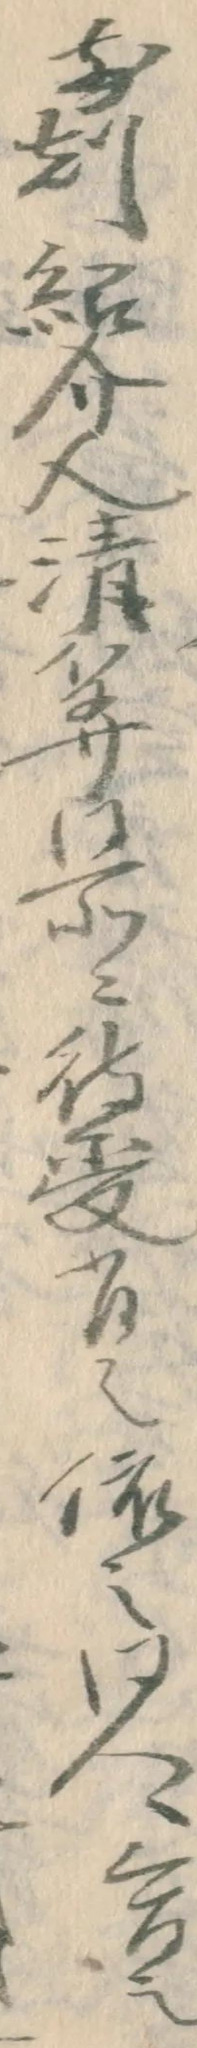前刻紹介人清算同所に待受有之依之同人へ今日之
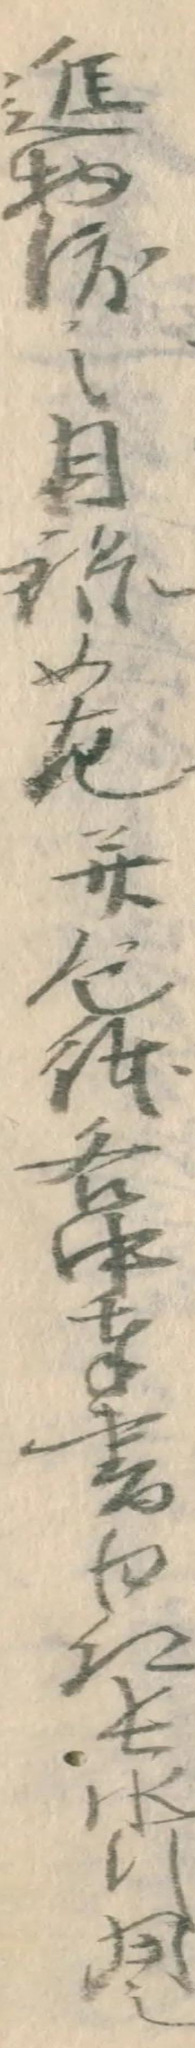進物渡之目録如左幷包紙各中奉書白紅長水引用之
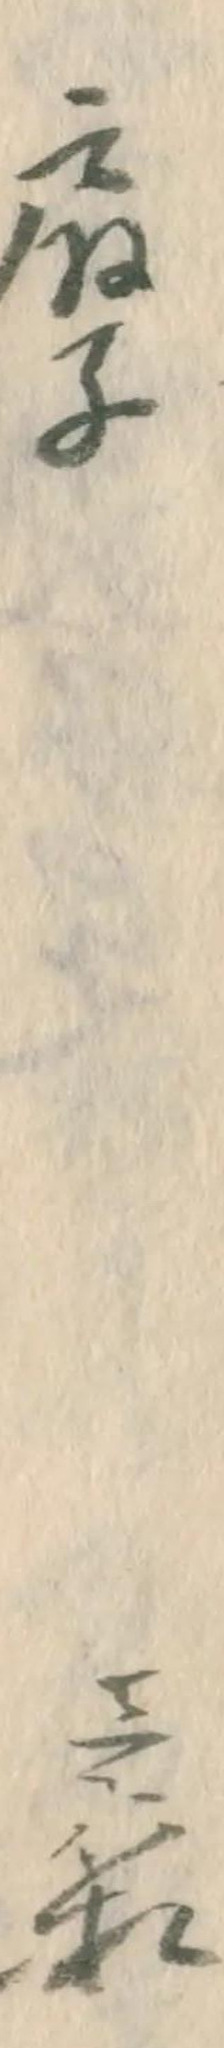扇子壱箱
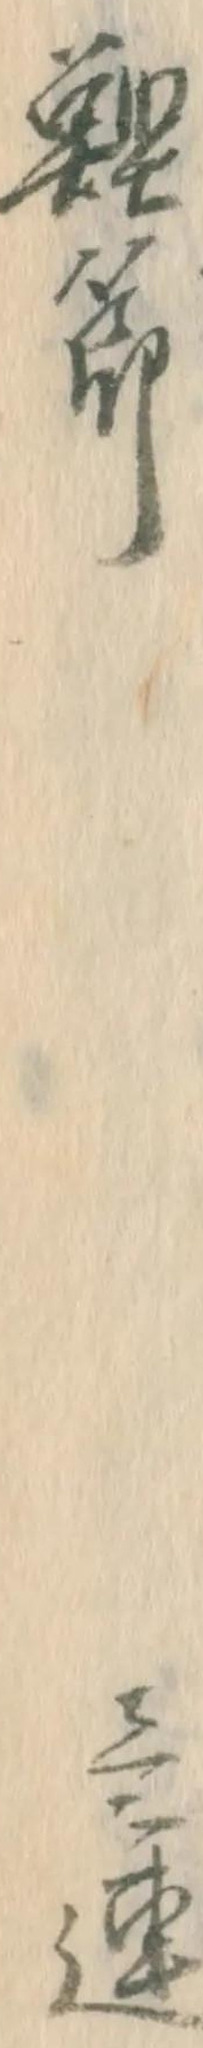鰹節壱連

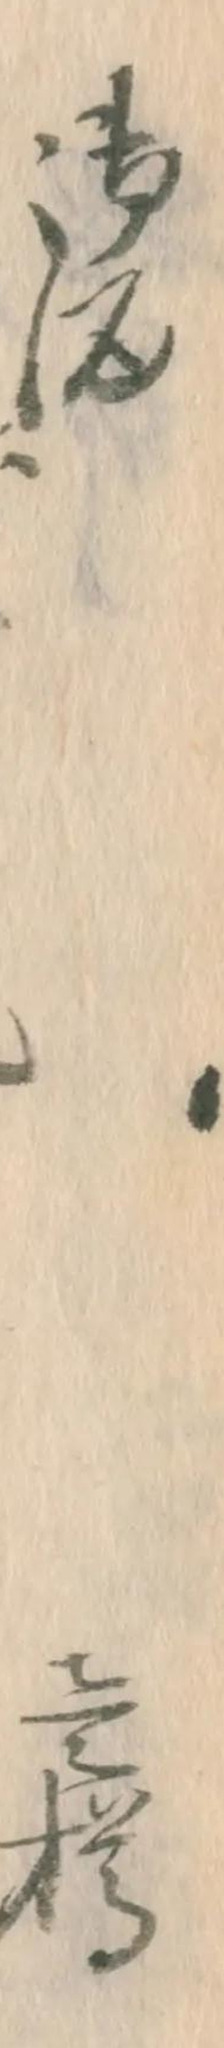御酒壱樽
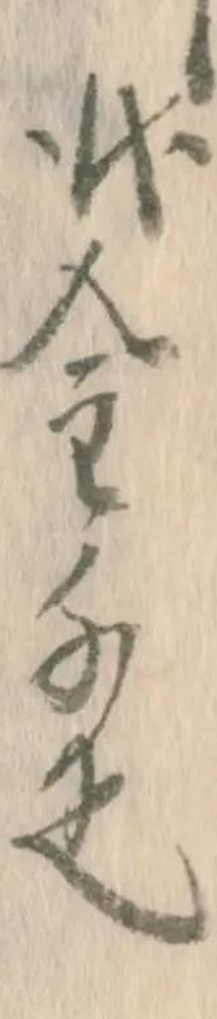代金千疋
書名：賀茂社記録. 第67冊
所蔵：国立国会図書館 National Diet Library, JAPAN
